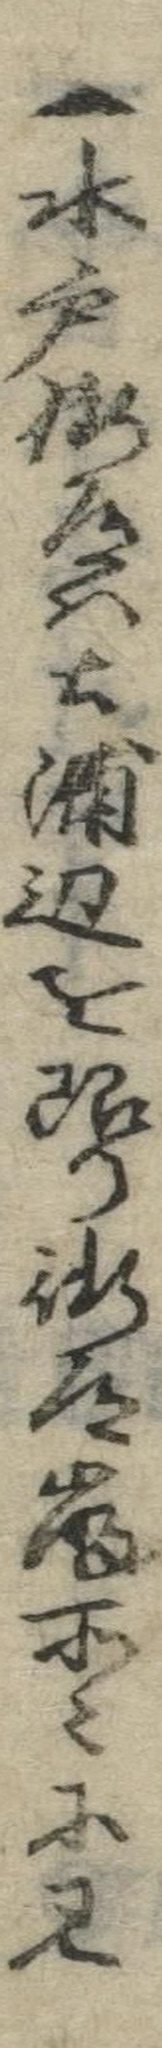▲水戸街道ハ土浦を限り街道筋所々に見
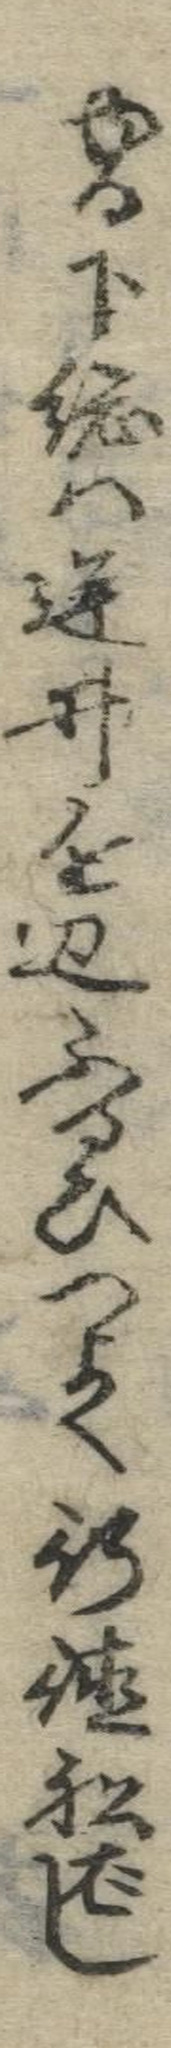ゆる下総ハ逆井近辺ふるひつよく行徳船橋
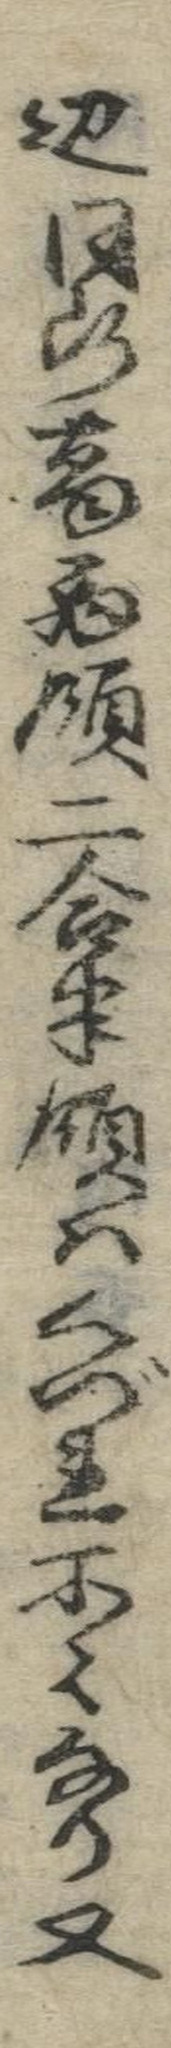辺同断葛西領二合半領ハくづれ所々なり又
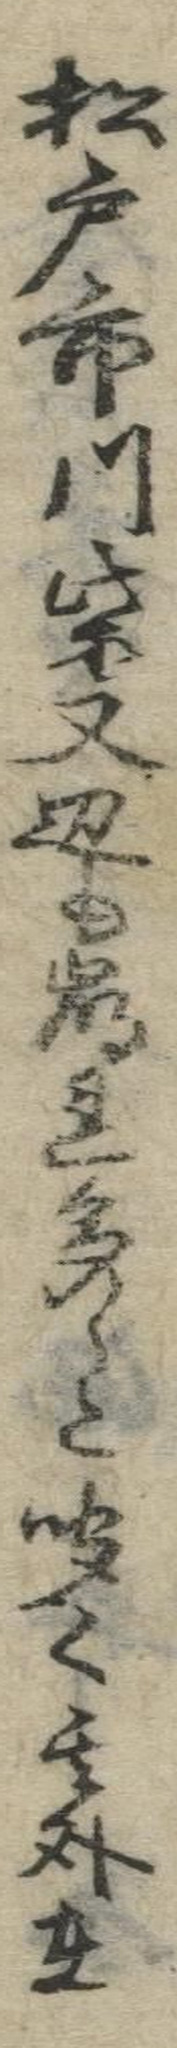松戸市川柴又辺も崩れ多しと聞く其外在
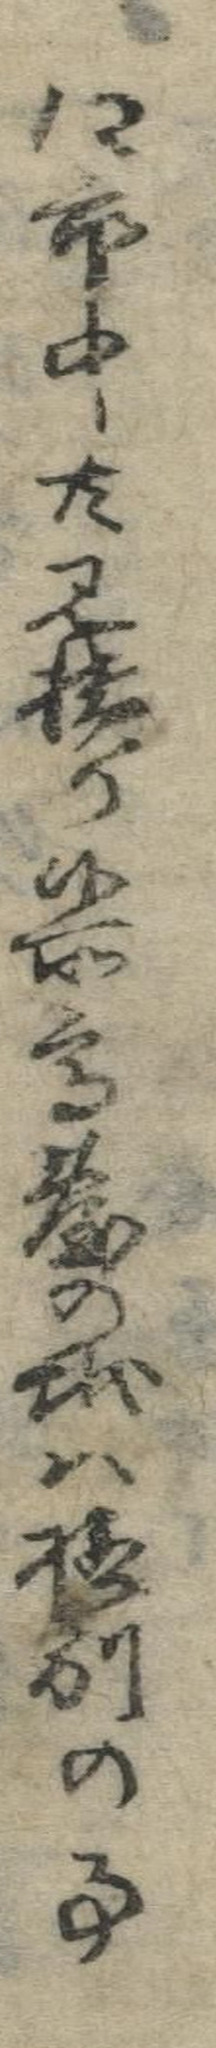郷市中とも見積り候所高場の地ハ格別の事
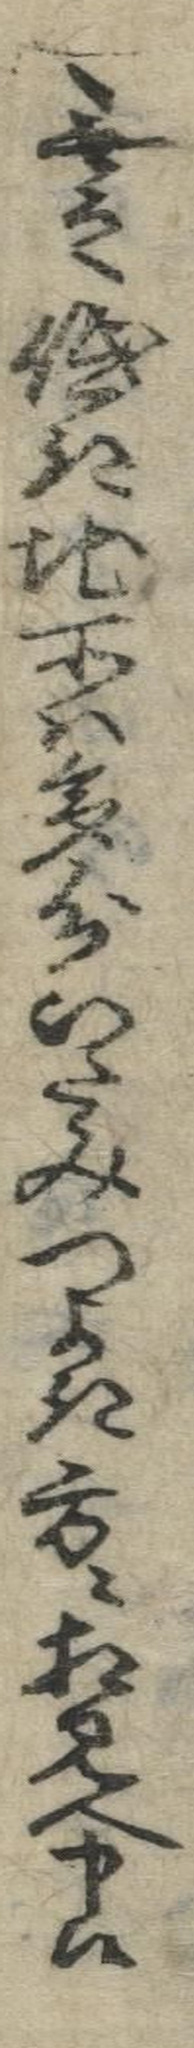無之低き地所ハ多分いたみつよき方二相見へ申候
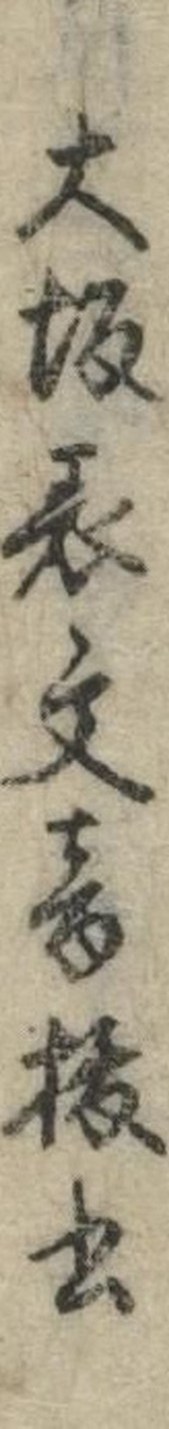大坂表文書抜書
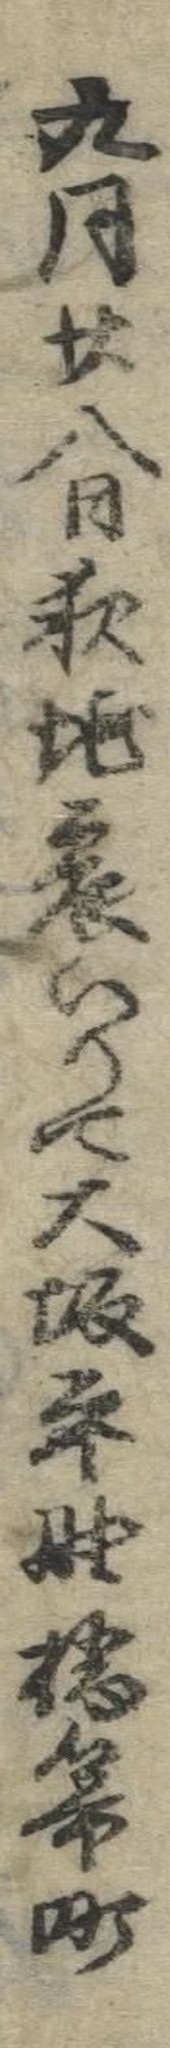九月廿八日夜地震いりて大坂平野橋箒町
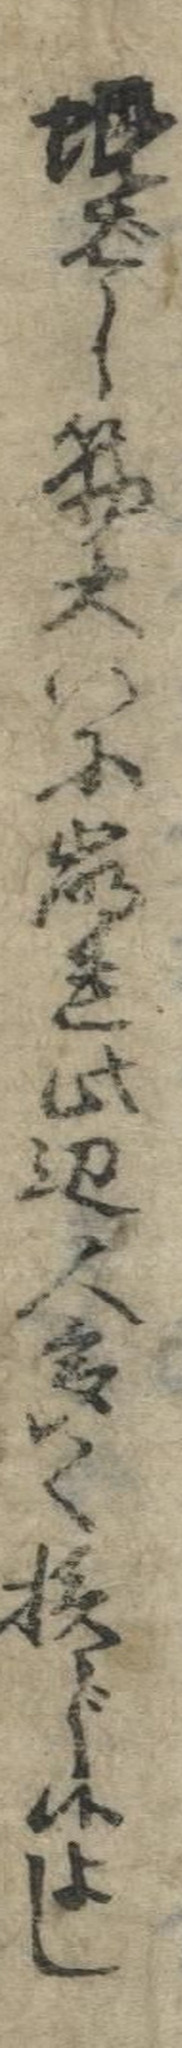覗ばし筋大いに崩れ此辺人多く損じ候よし
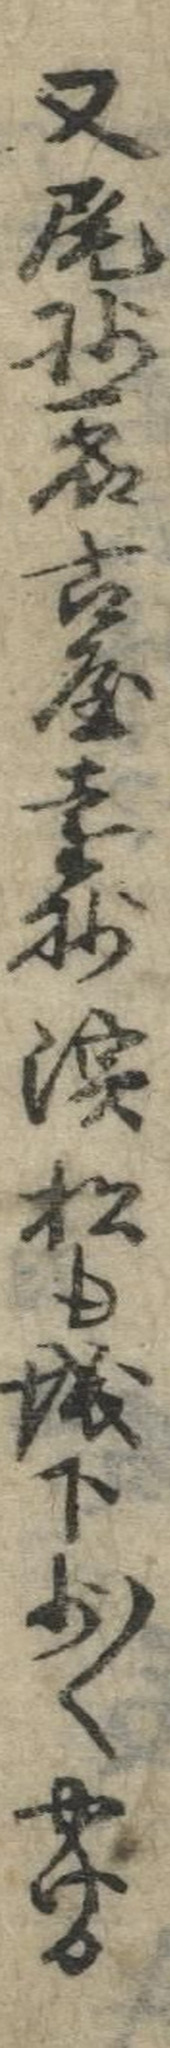又尾州名古屋遠州浜松も城下少々やける
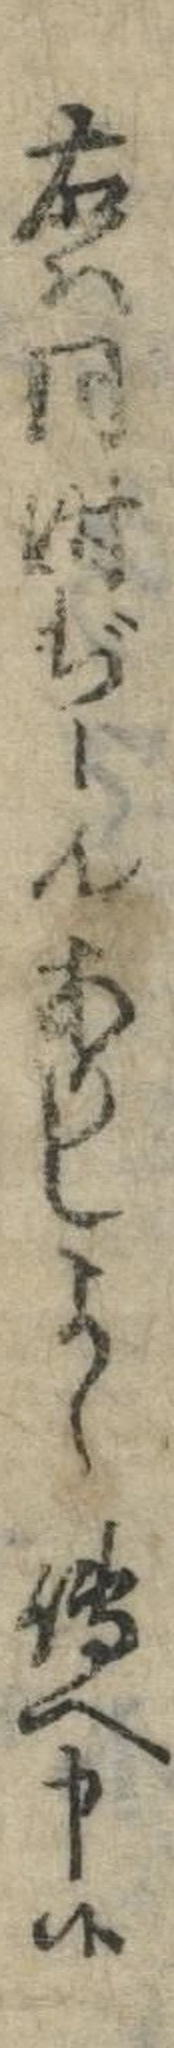右ハ同時ぢしんありしよし伝へ申候
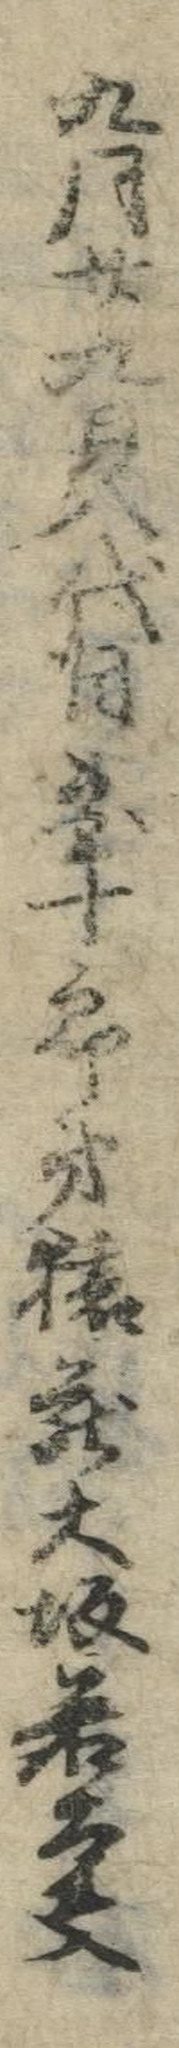九月廿九日八代目団十郎弟猿蔵大坂若太夫
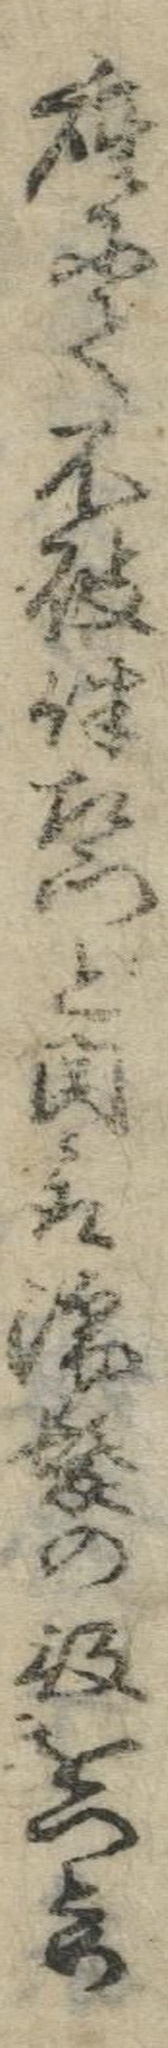座にて不破伴左衛門と関取濡髪の役をつとめ
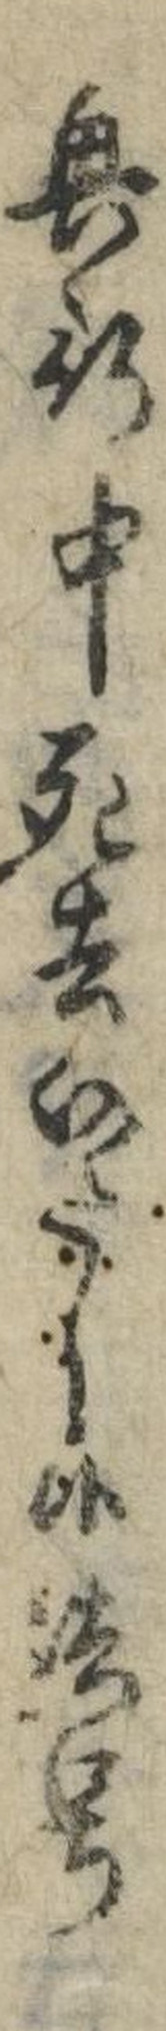興行中死去いたし候法号
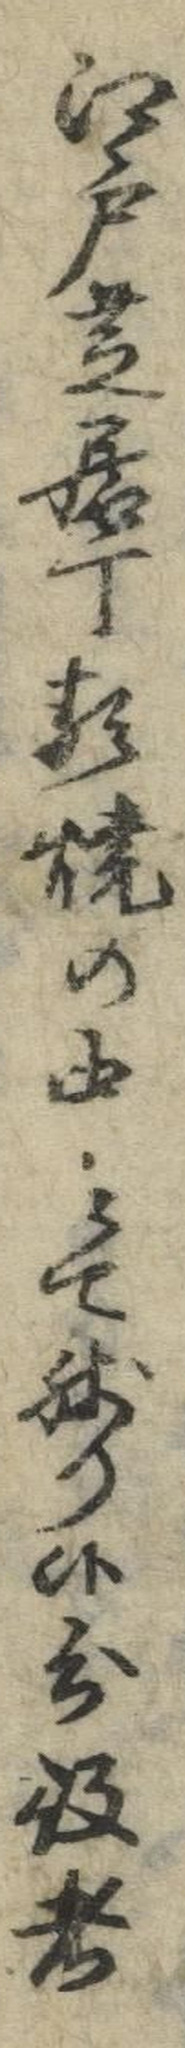江戸芝居丁類焼の中にて残り候分役者
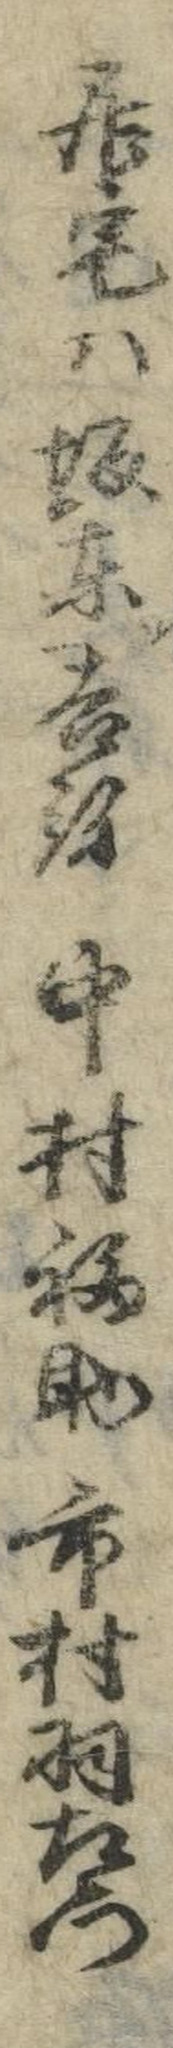居宅ハ坂東吉弥中村福助市村羽左衛門
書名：安政二卯十月二日夜四ツ時過　御府内御屋敷方市中共　地震類焼場所明細書之寫　并街道筋近郷聞書
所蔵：東京大学地震研究所図書室 Earthquake Research Institute Library, The University of Tokyo, JAPAN
